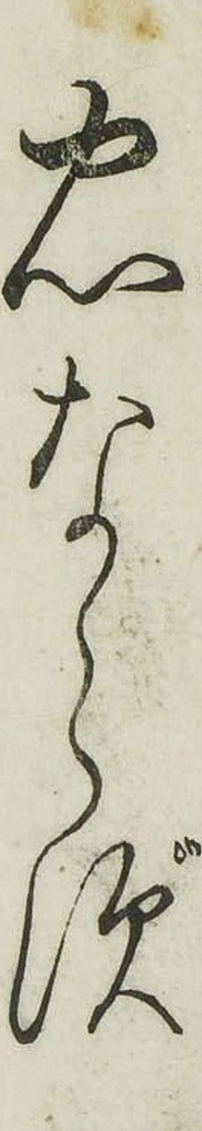忠ならず
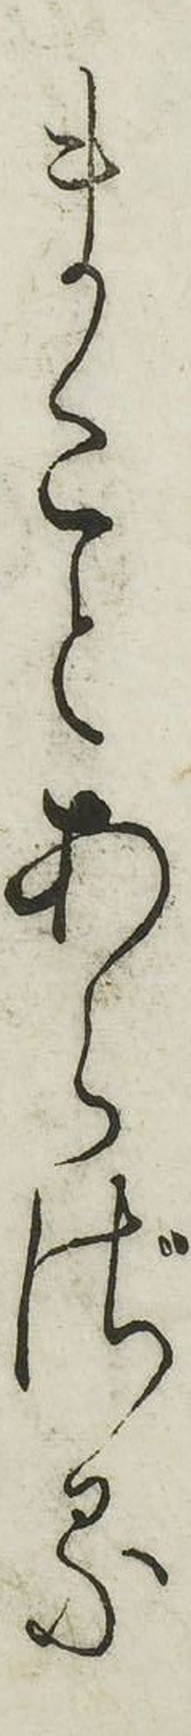まことあらざる
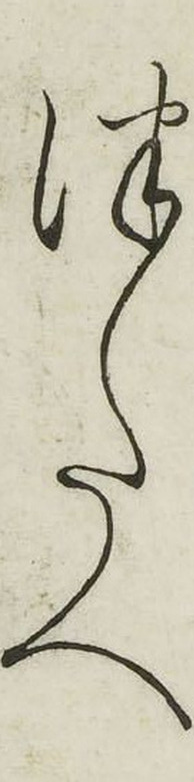つたへ
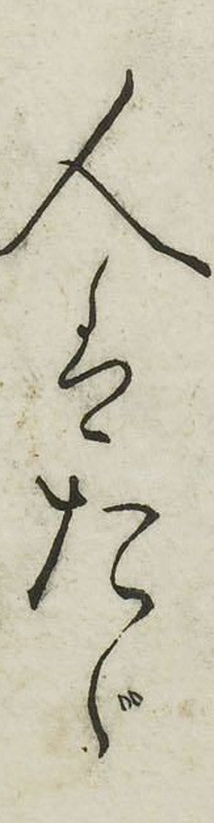人はたゞ
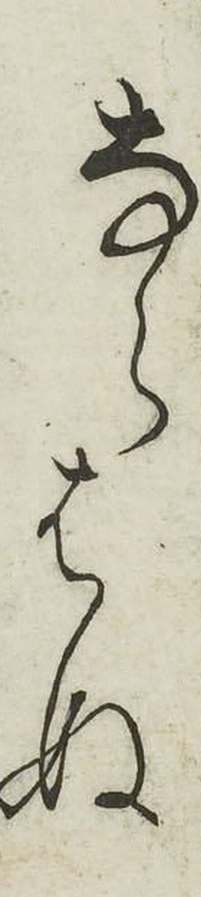ならはぬ
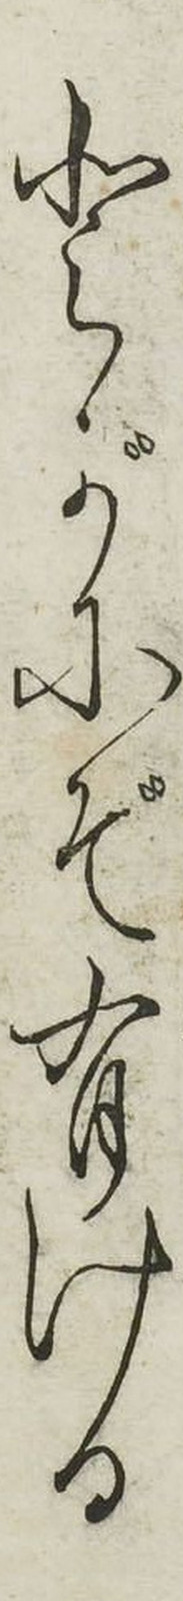とがにぞ有ける
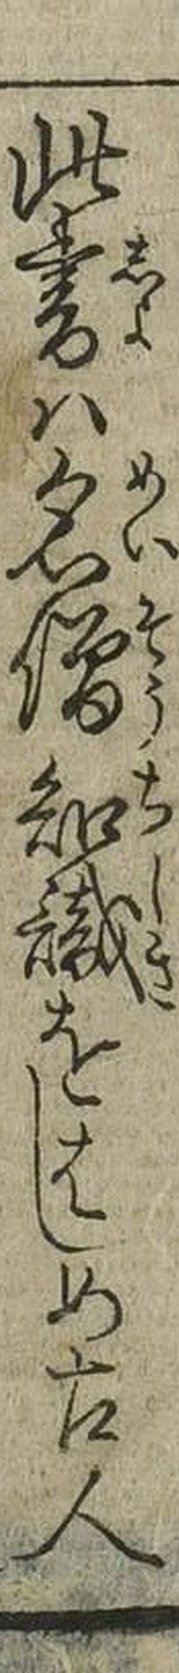此書は名僧知識をはしめ古人
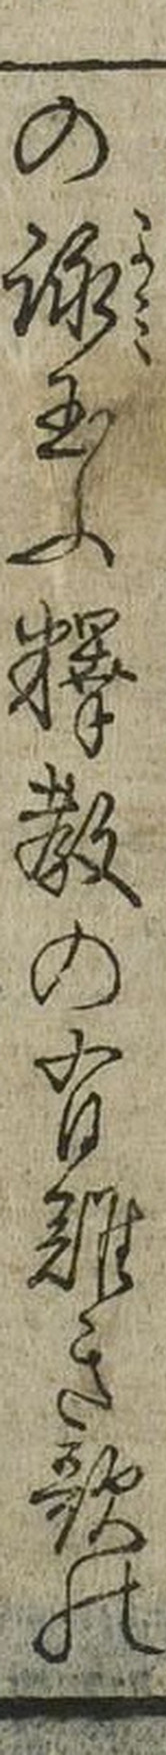の詠玉ふ釈教の有難き歌の
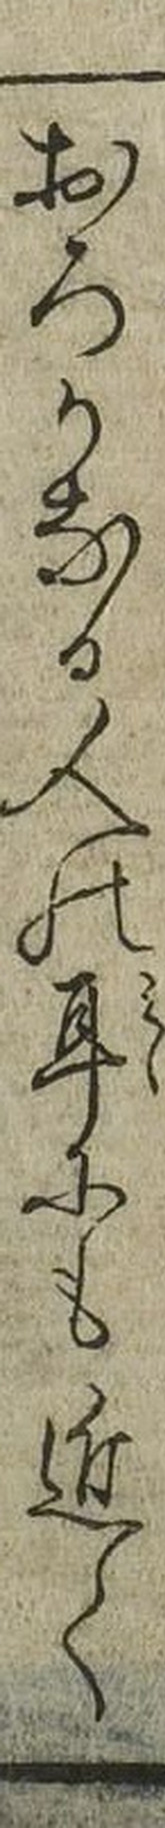おろかなる人の耳にも近く
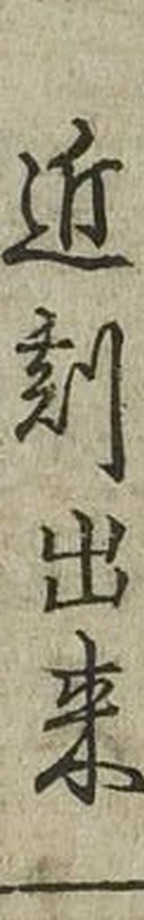近刻出来
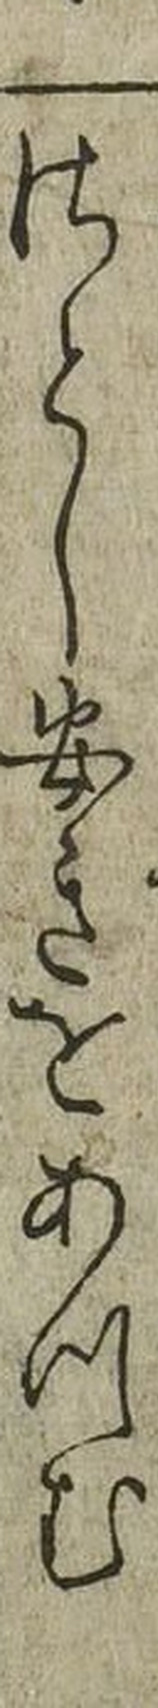さとし安きをあつむ
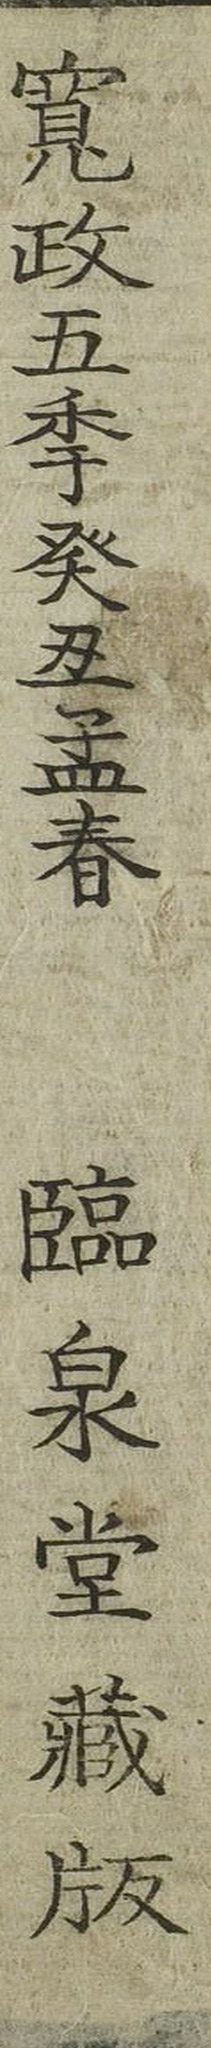寛政五季癸丑孟春臨泉堂蔵版
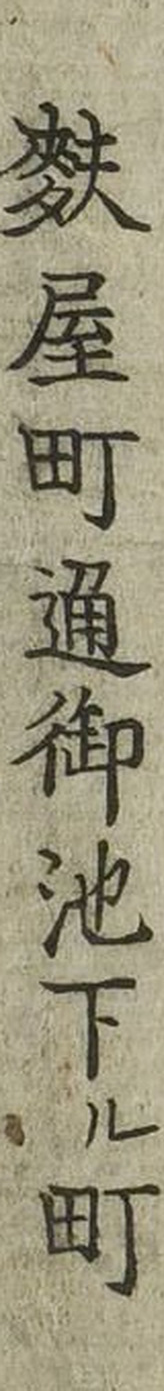麩屋町通御池下ル町
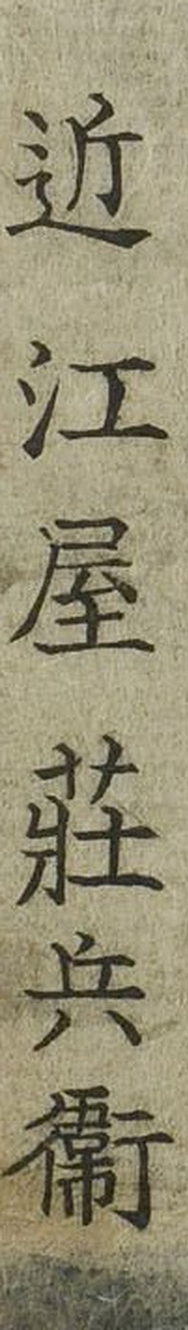近江屋荘兵衛
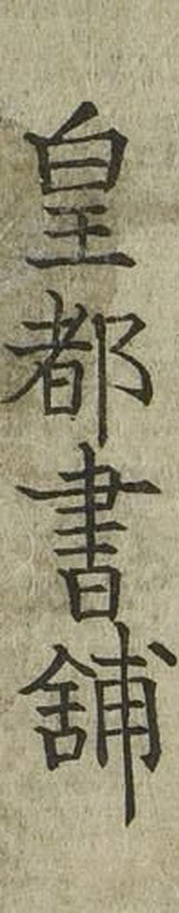皇都書舗
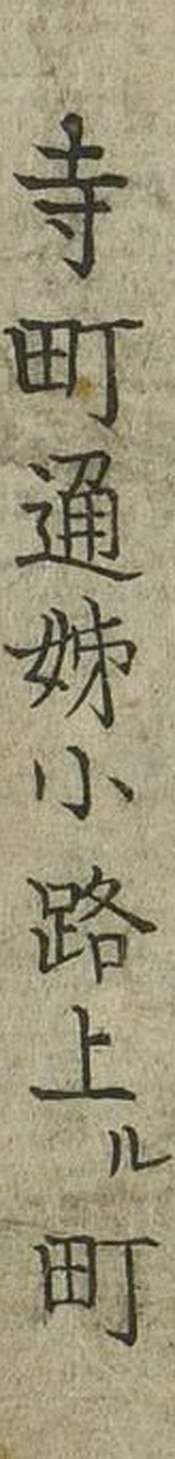寺町通姉小路上ル町
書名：五拾人一首
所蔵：東京学芸大学教育コンテンツアーカイブ
